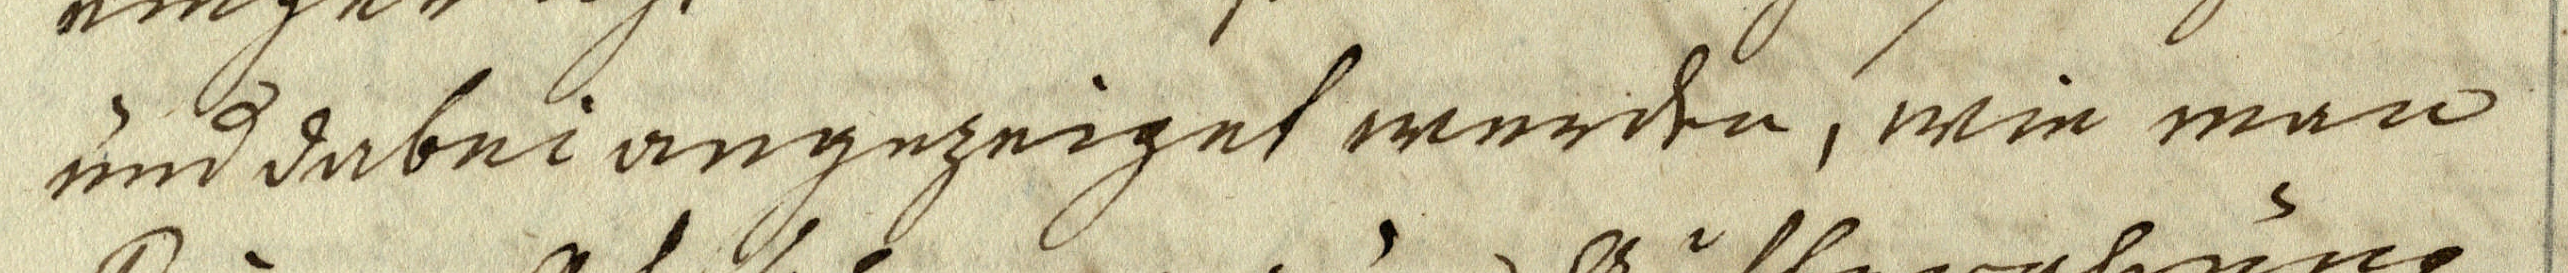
und dabei angezeiget werden, wie man
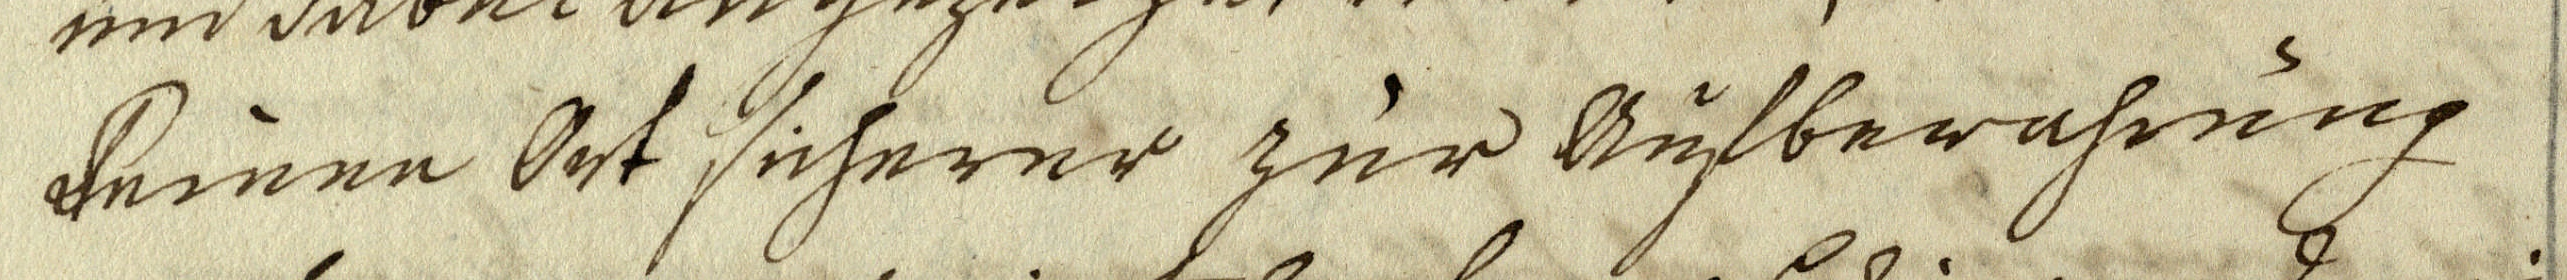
keinen Ort sicherer zur Aufbewahrung
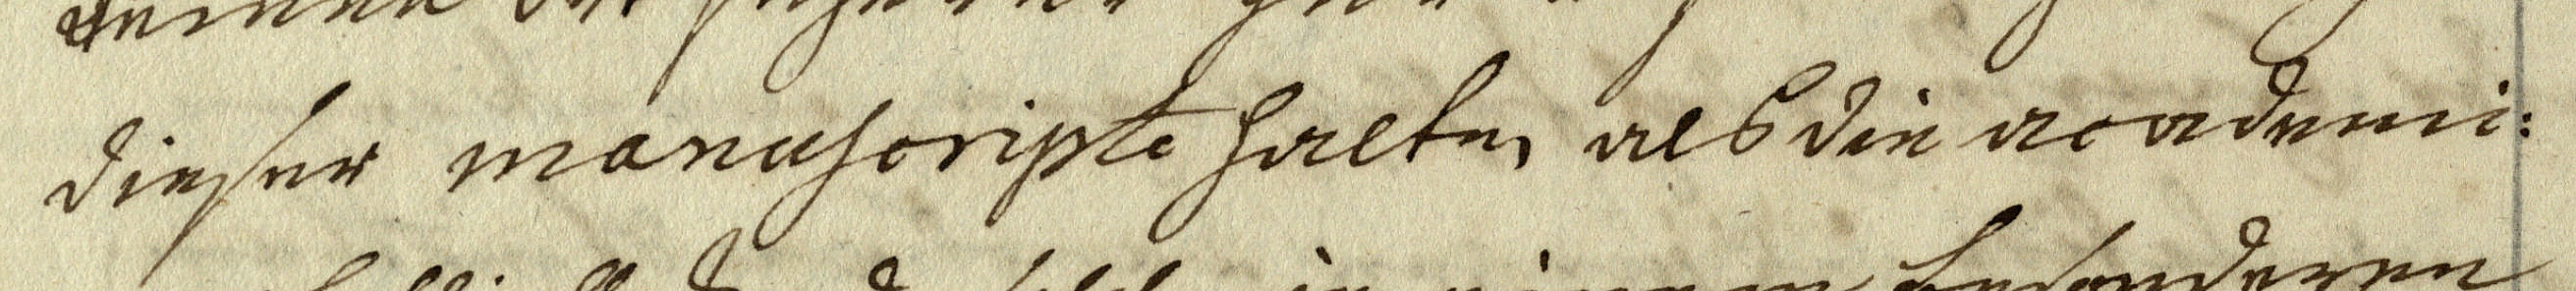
dieser manuscripte halte, als die academi¬
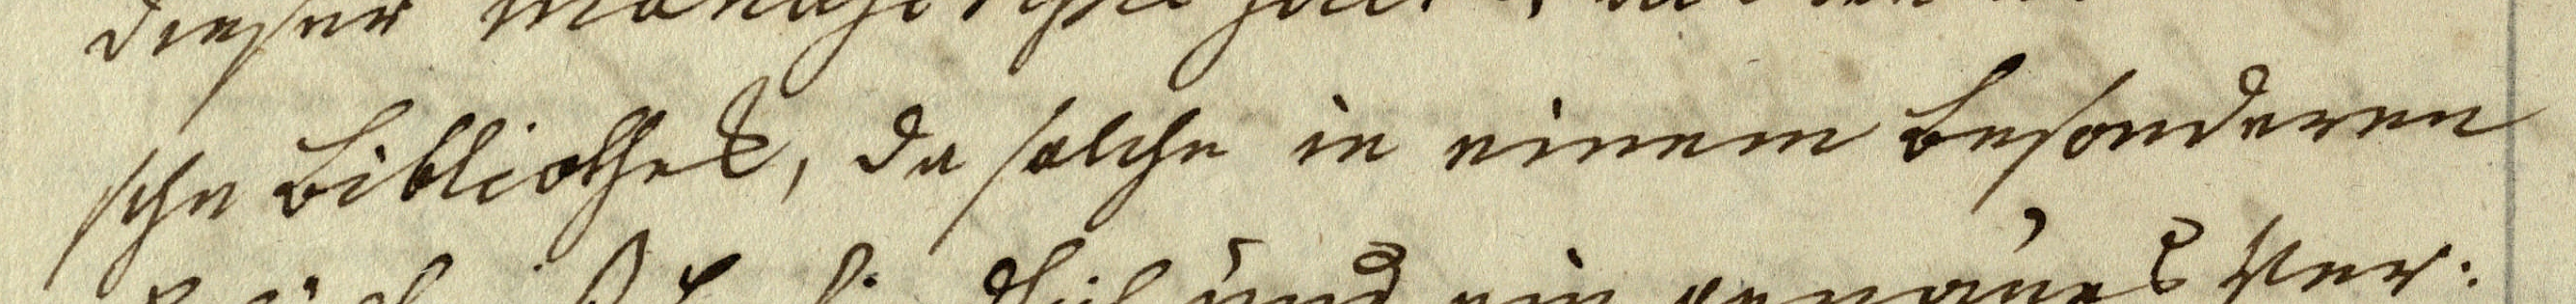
sche Bibliothek, da solche in einem besonderen
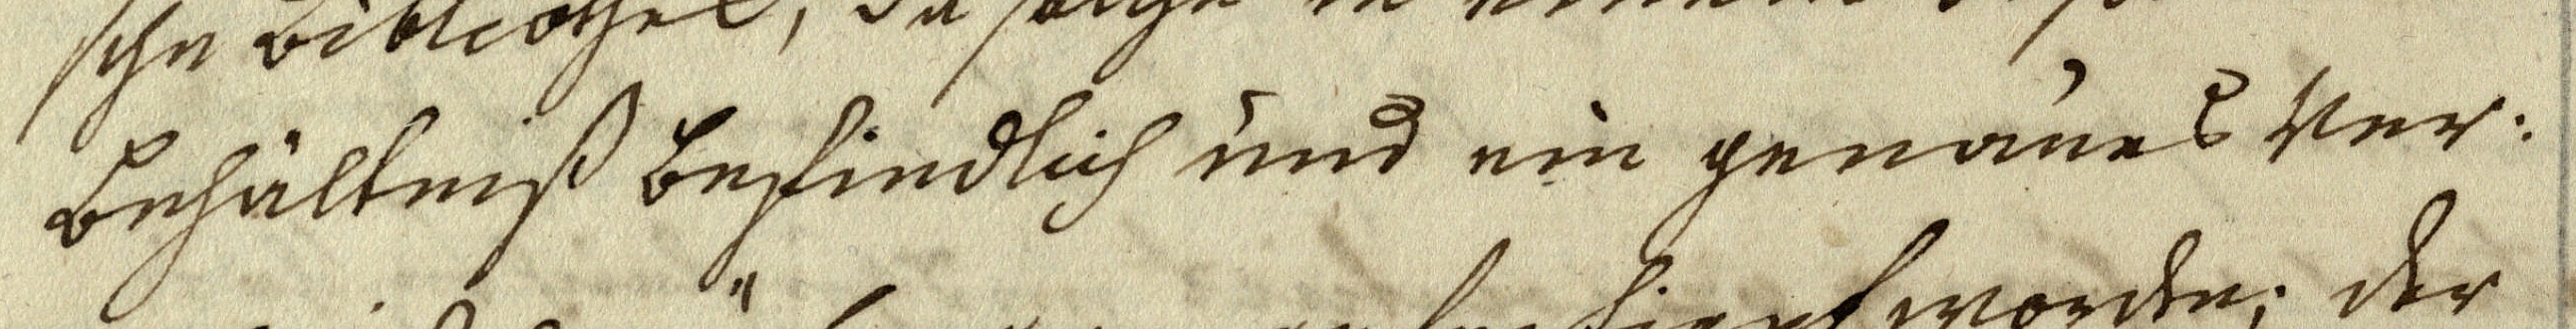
Behältniß befindlich und ein genaues Ver¬
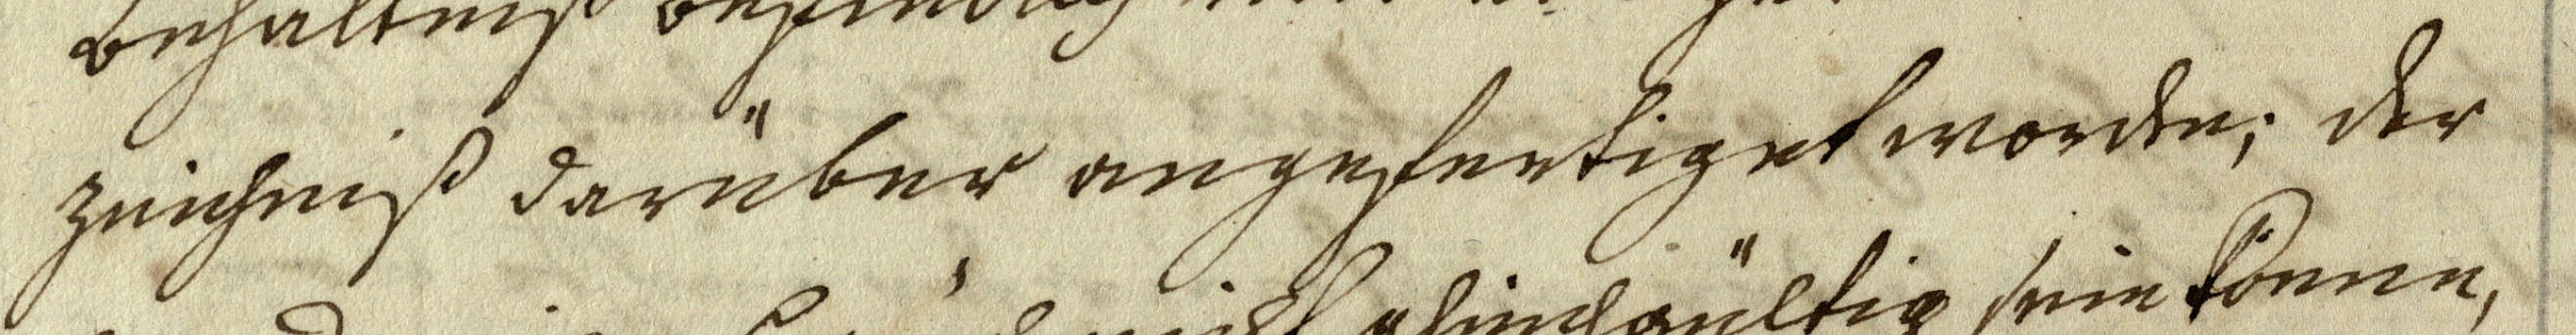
zeichniß darüber angefertiget worden; der
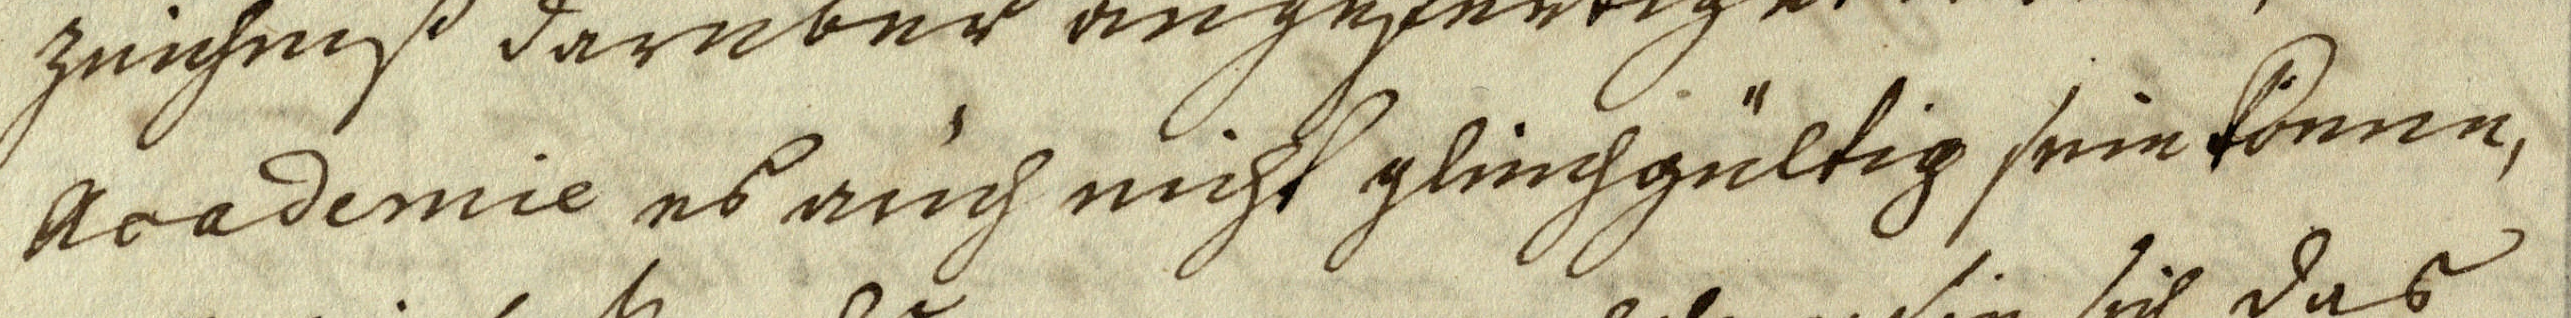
Academie es auch nicht gleichgültig sein könne,
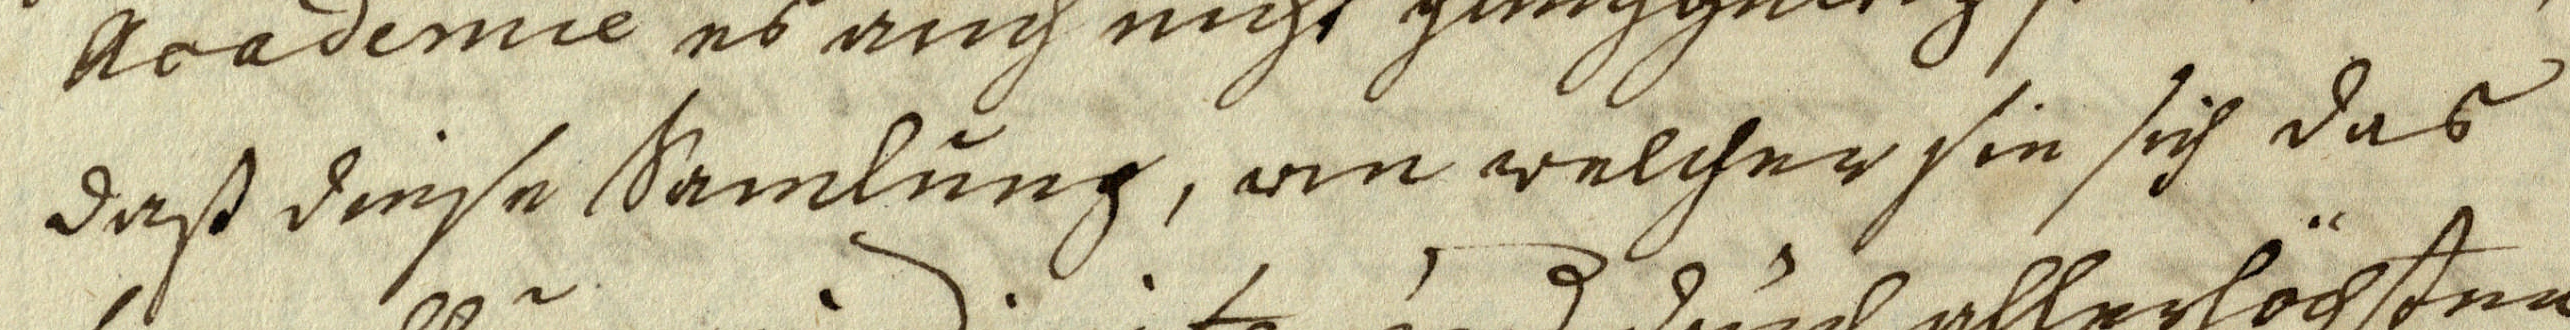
daß diese Samlung, an welcher sie sich das
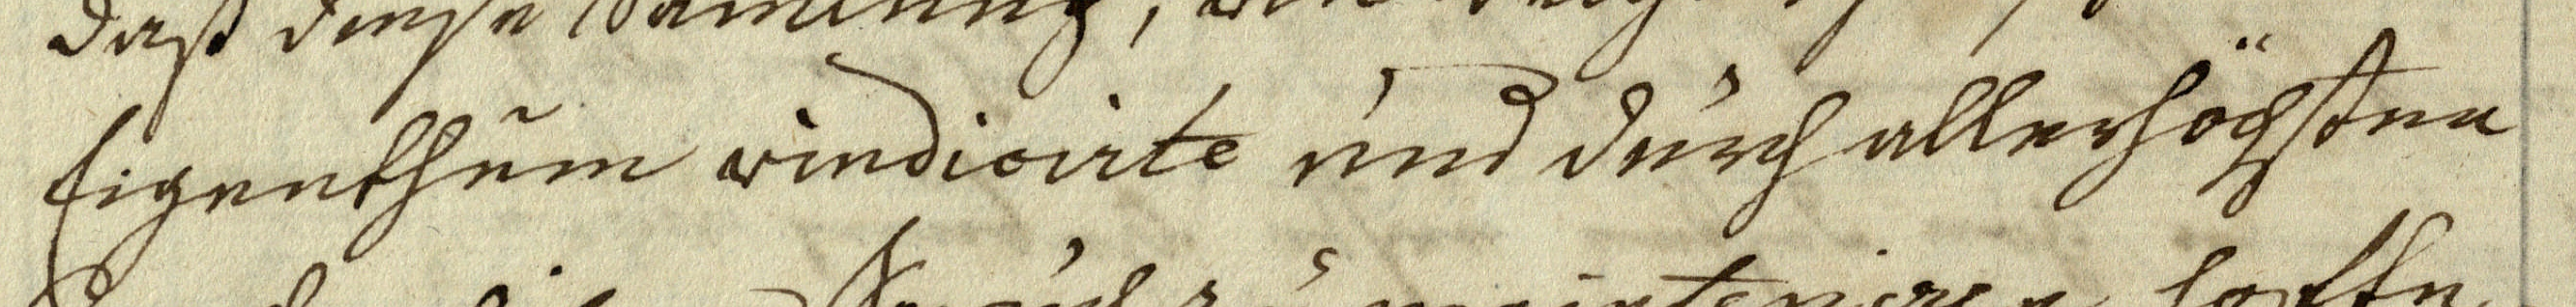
Eigenthum vindicirte und durch allerhöchsten
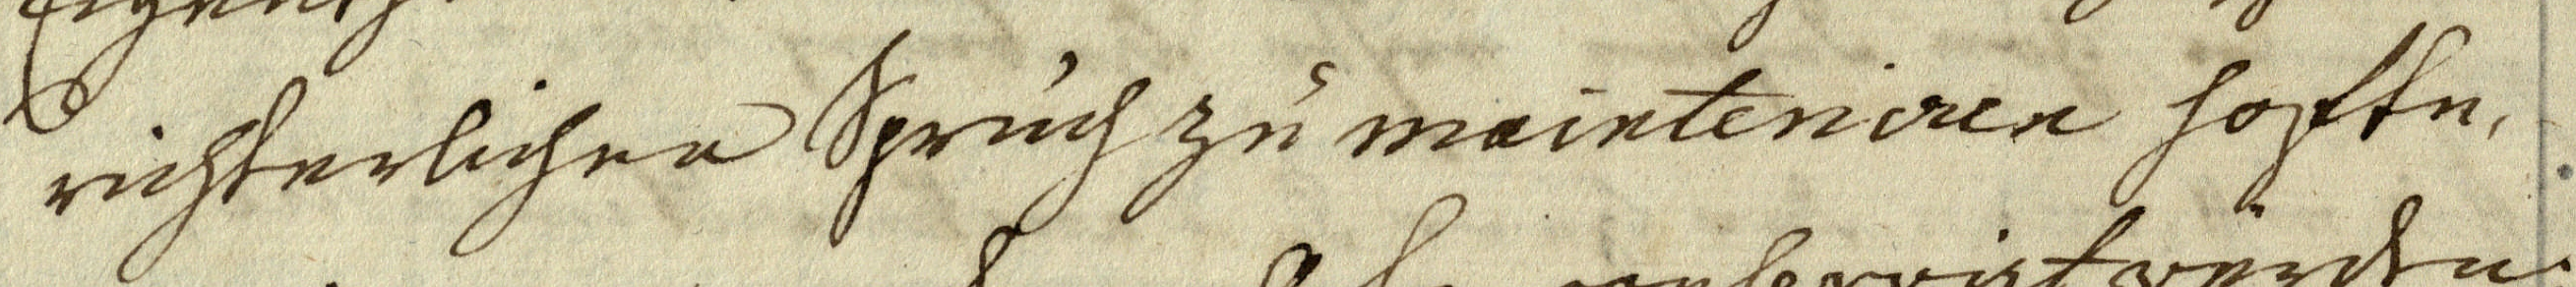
richterlichen Spruch zu mainteniren hofte,
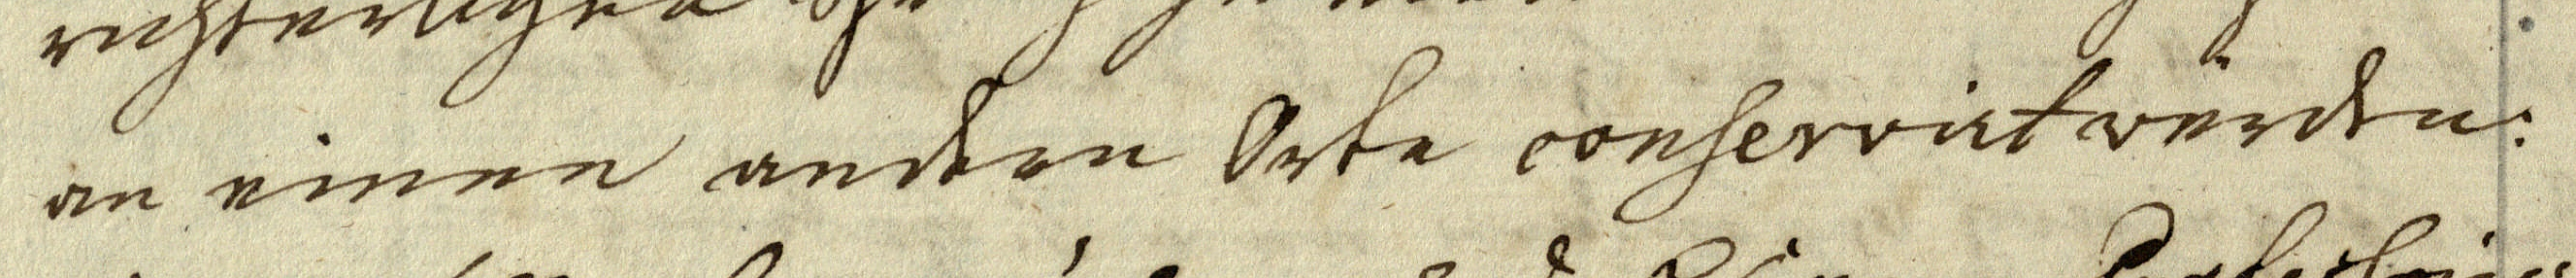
an einem andern Orte conservirt würden.
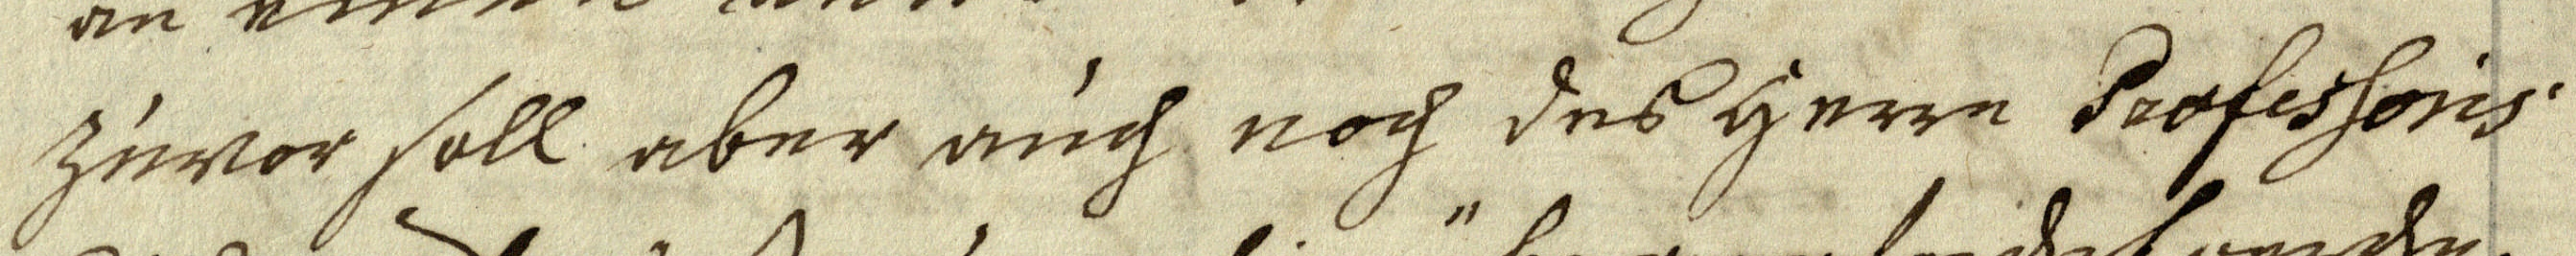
Zuvor soll aber auch noch des Herrn Professoris
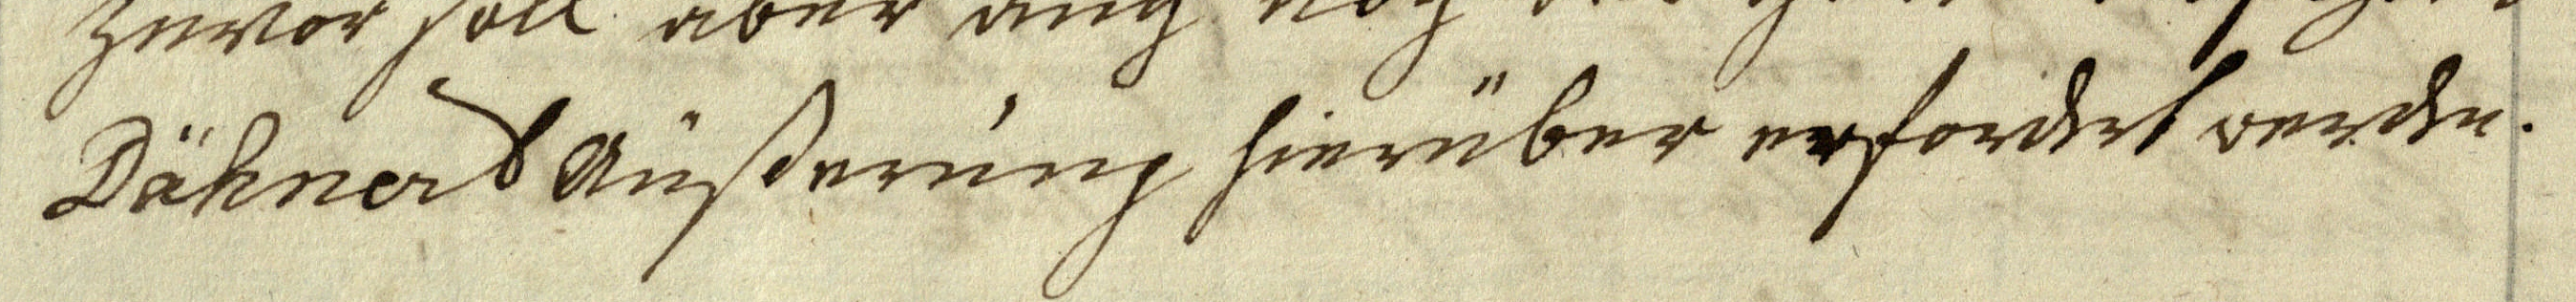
Dähnert Äußerung hierüber erfordert werden.
